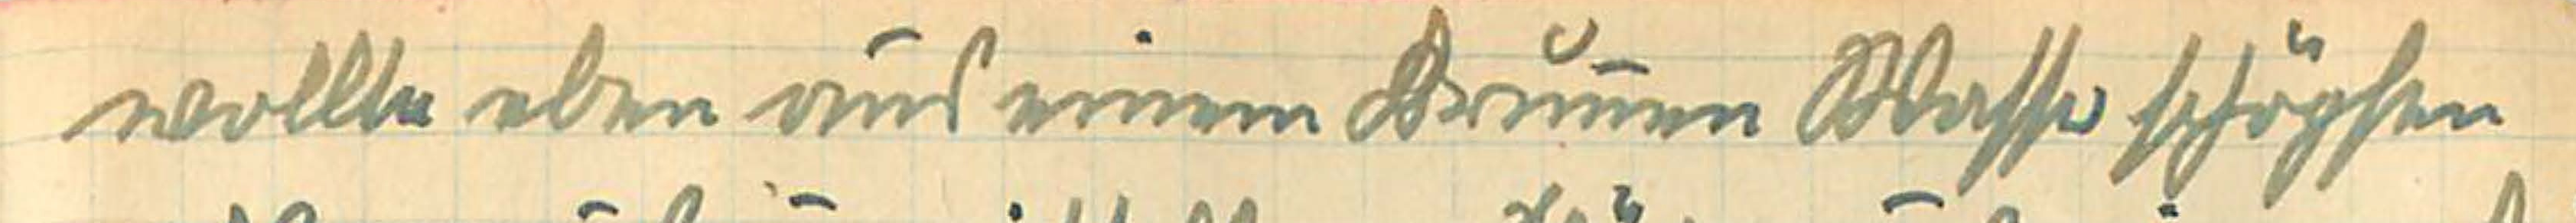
wollte eben aus einem Brunnen Wasser schöpfen
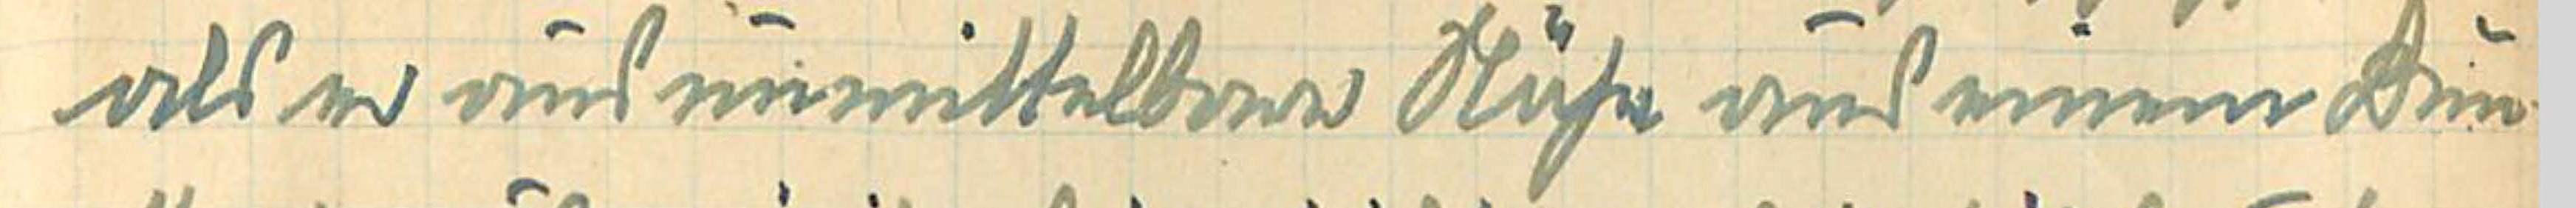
als er aus unmittelbarer Nähe aus einem Bun-
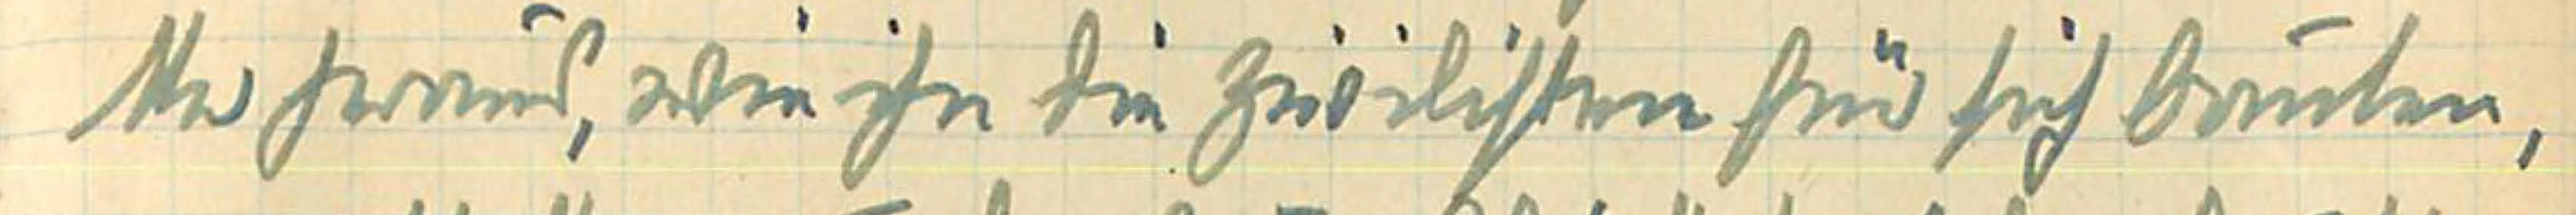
ker heraus, wie ihn die Zivilisten für sich bauten,
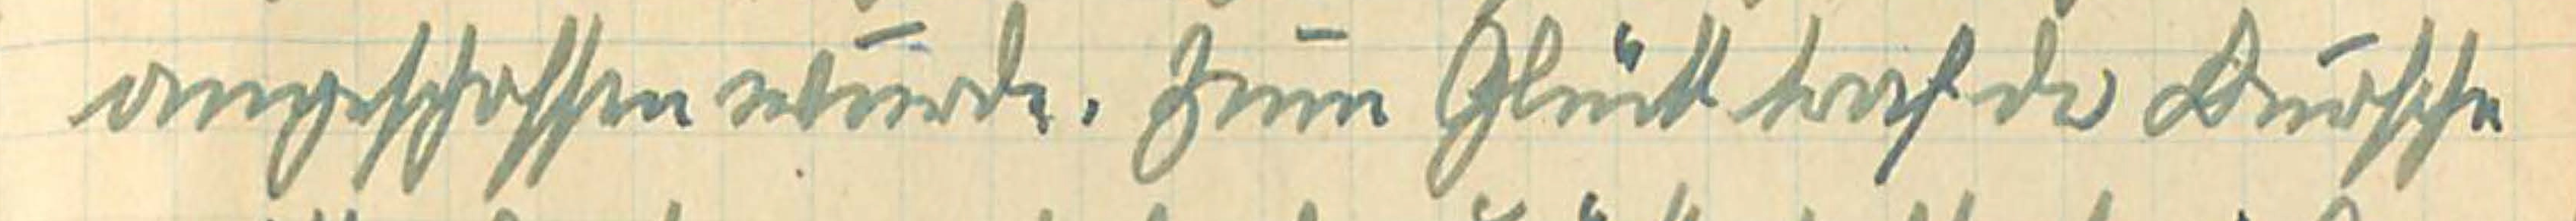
angeschossen wurde. Zum Glück traf der Bursche
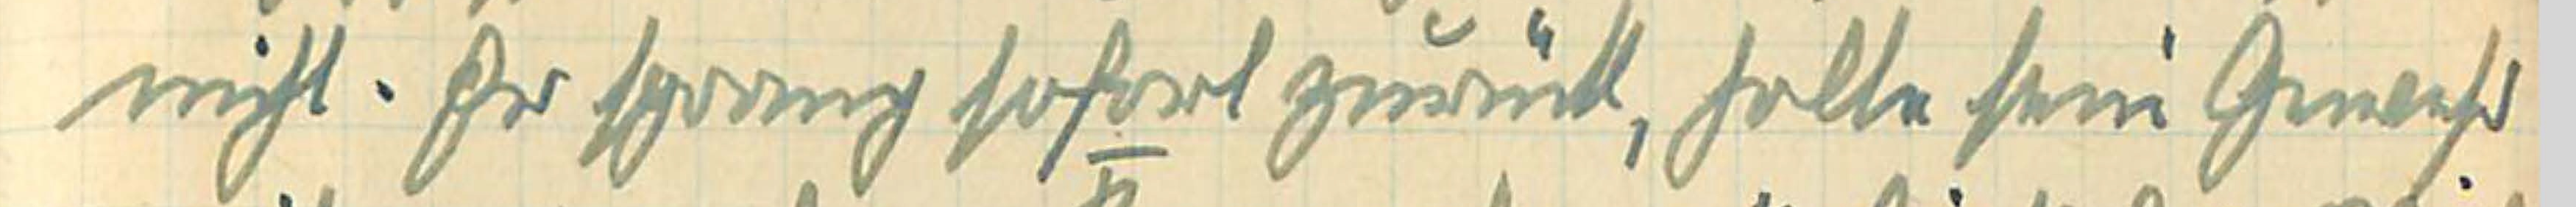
nicht. Er sprang sofort zurück, holte sein Gewehr
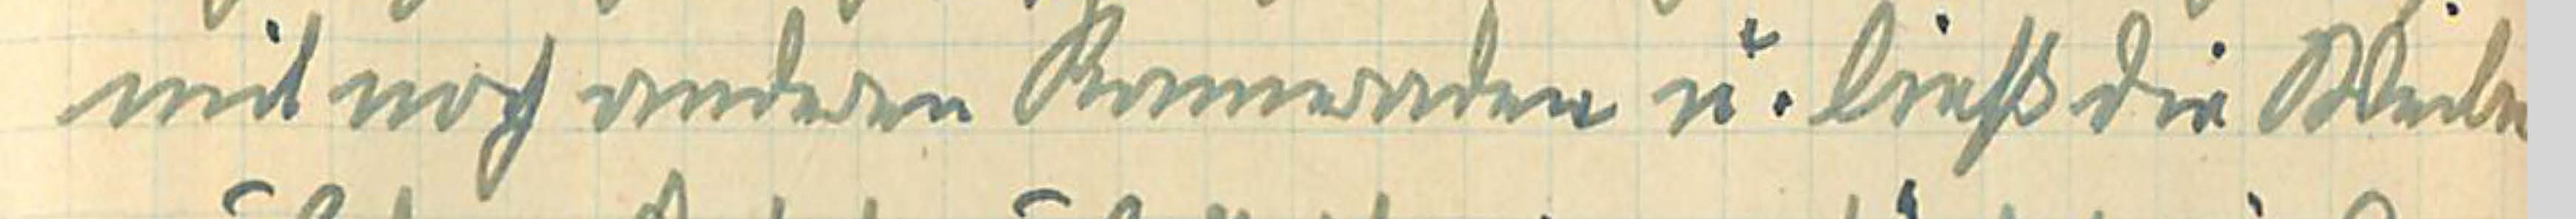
mit noch anderen Kameraden u. ließ die Weiber
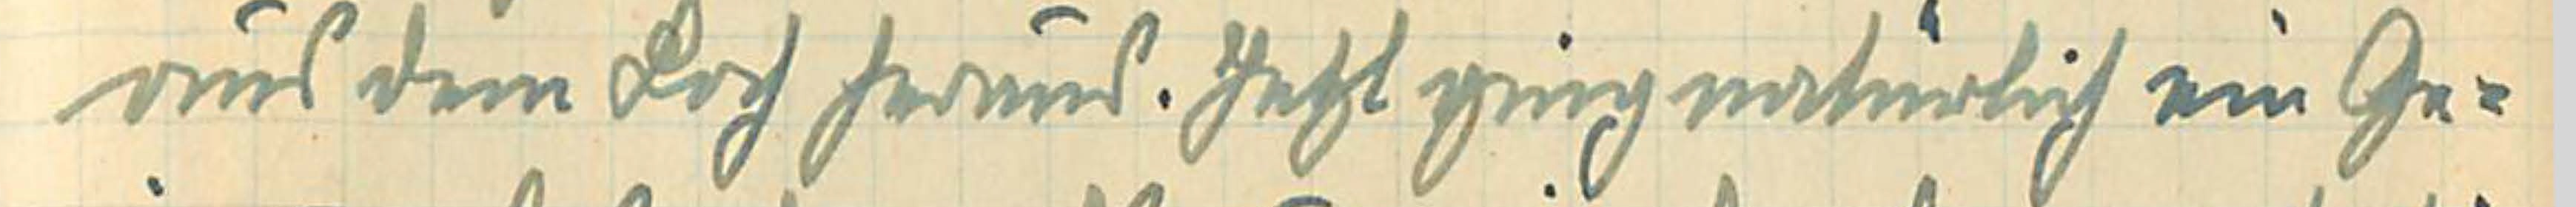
aus dem Loch heraus. Jetzt ging natürlich ein Ge-
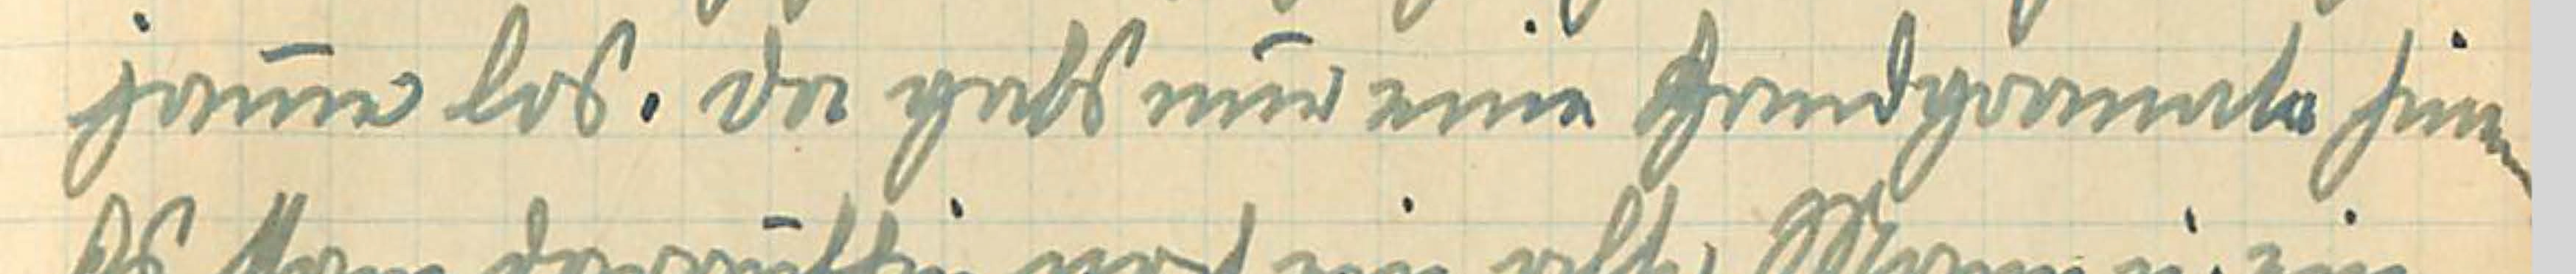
jammer los. Da gabs nur eine Handgranate hinein.
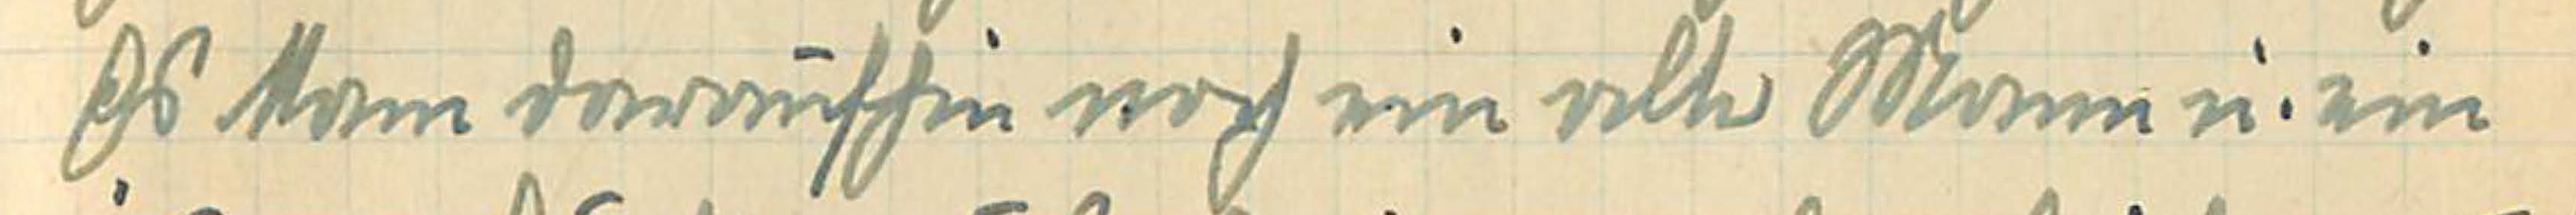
Es kam daraufhin noch ein alter Mann u. ein
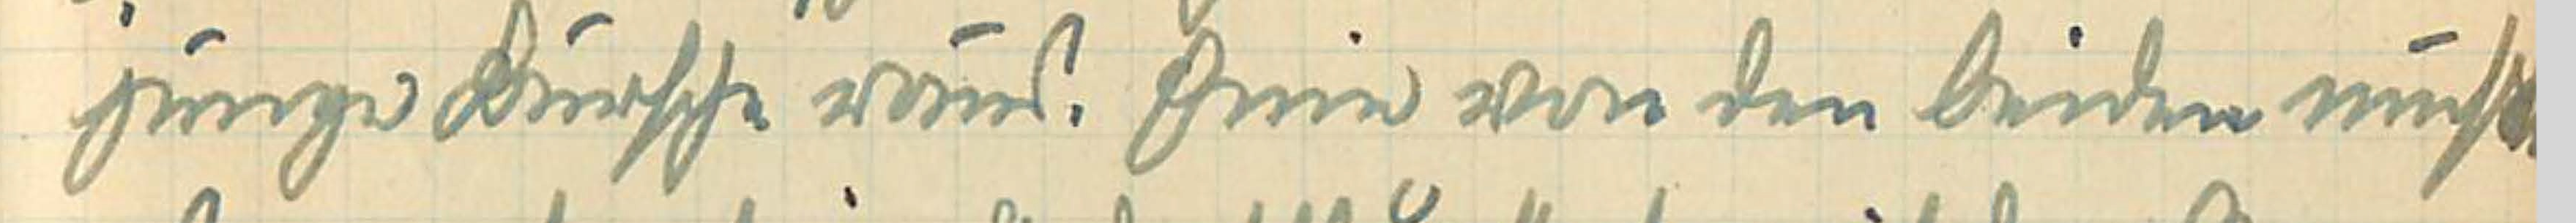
junger Bursche raus. Einer von den beiden mußte
